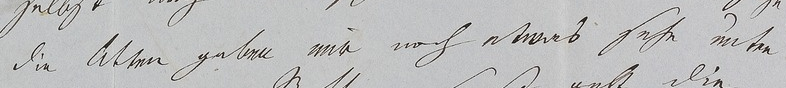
die Akten gaben mir noch etwas sehr unter-
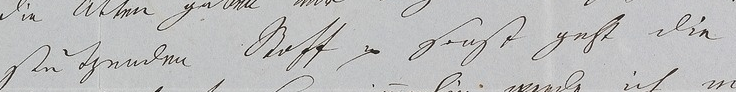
stützenden Stoff & sonst geht die
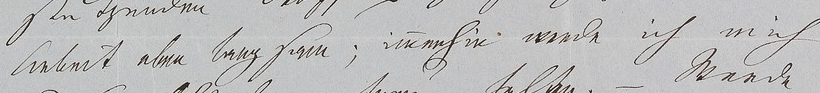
Arbeit eben langsam; immerhin werde ich mich
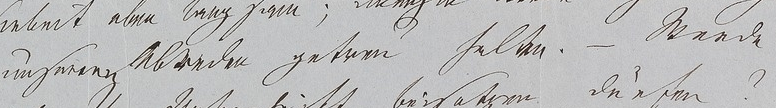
unseren Abreden getreu halten. – Werde
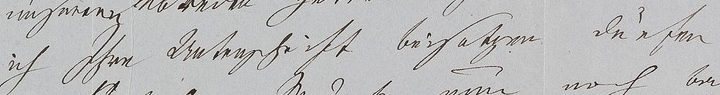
ich Ihre Unterschrift beisetzen dürfen?
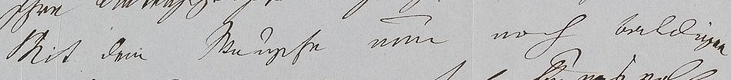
Mit dem Wunsche nun nach baldiger
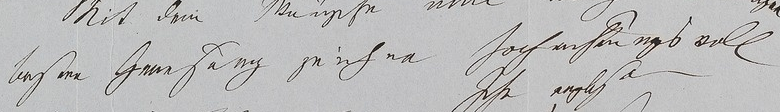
bester Genesung zeichne hochachtungsvoll
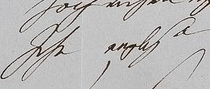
Ihr ergbster
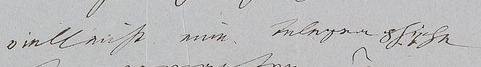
vielleicht eine telegraphische
